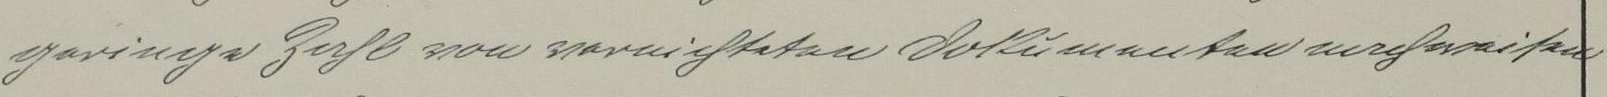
geringe Zahl von vernichteten Dokumenten nachweisen
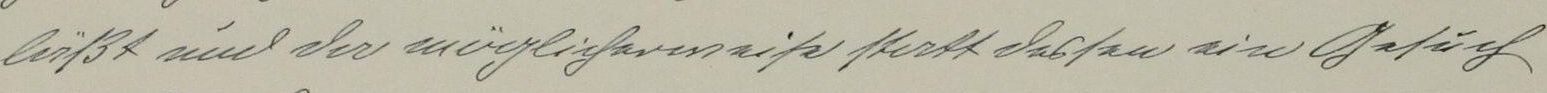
läßt und da möglicherweise statt dessen ein Gesuch
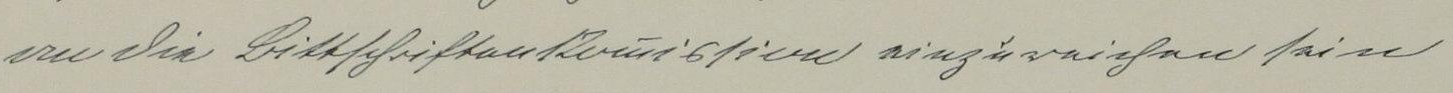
an die Bittschriftenkommission einzureichen sein
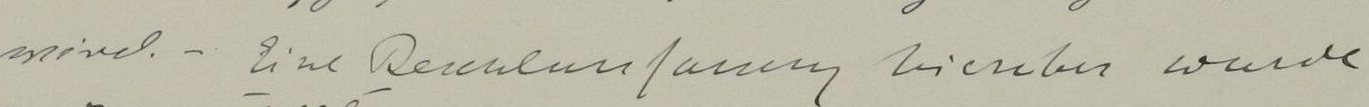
wird. - Eine Beschlussfassung hierüber wurde
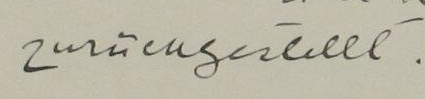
zurückgestellt.
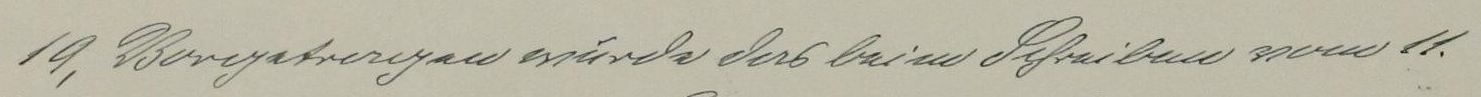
19. Vorgetragen wurde das beim Schreiben vom 11.
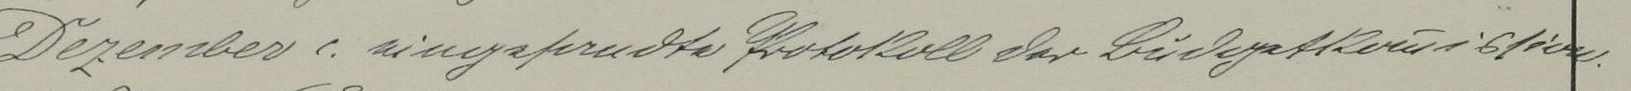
Dezember c. eingesandte Protokoll der Budgetkommission
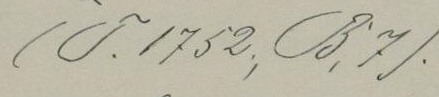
(T.1752; B.7).
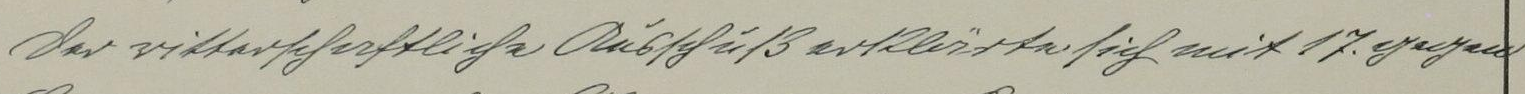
Der ritterschaftliche Ausschuß erklärte sich mit 17. gegen
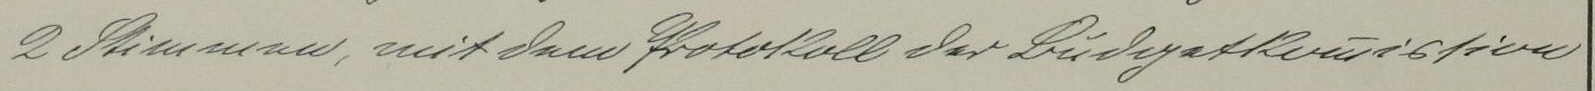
2 Stimmen, mit dem Protokoll der Budgetkommission
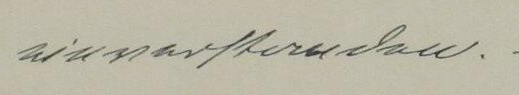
einverstanden.
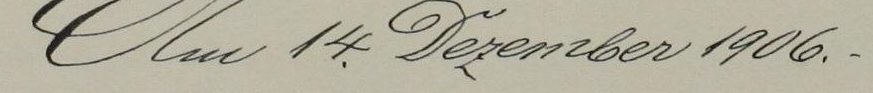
Am 14. Dezember 1906.
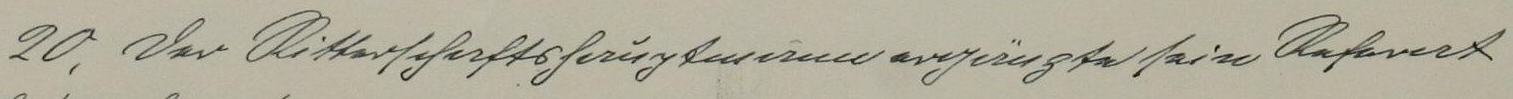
20. Der Ritterschaftshauptmann ergänzte sein Referat
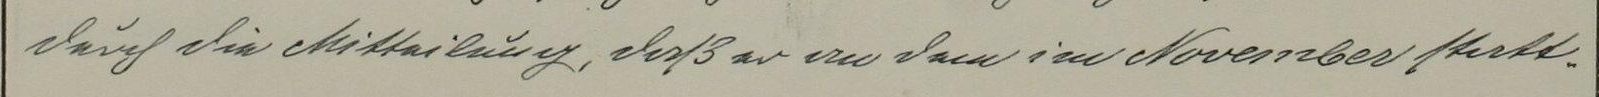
durch die Mitteilung, daß er an dem im November statt-
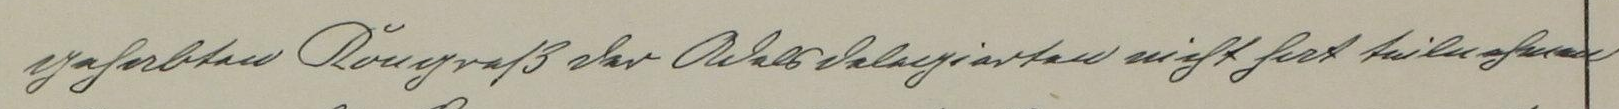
gehabten Kongreß der Adelsdelegierten nicht hat teilnehmen
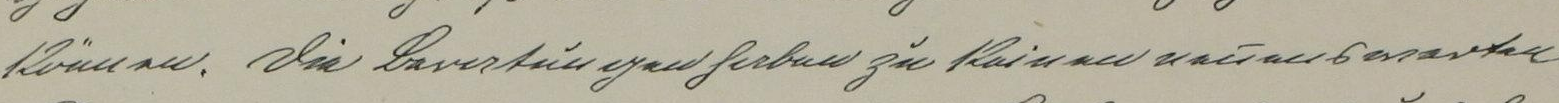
können. Die Beratungen haben zu keinen nennenswerten
